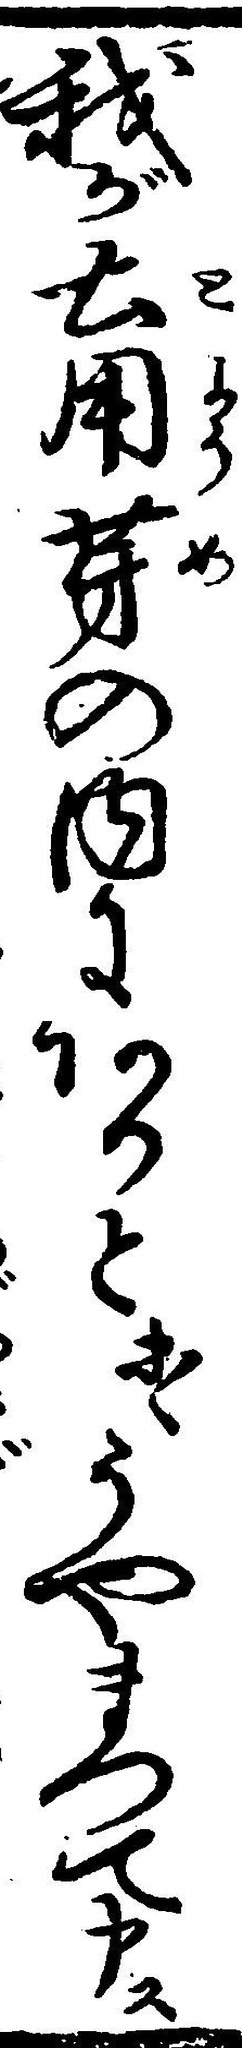我が土用芽の内にありとヽうやまつて申
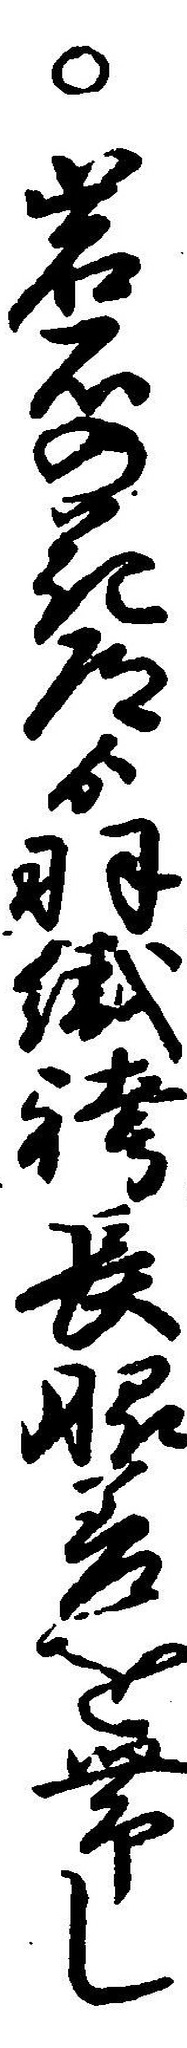○岩石の花道ゟ羽織袴長脇差を帯し
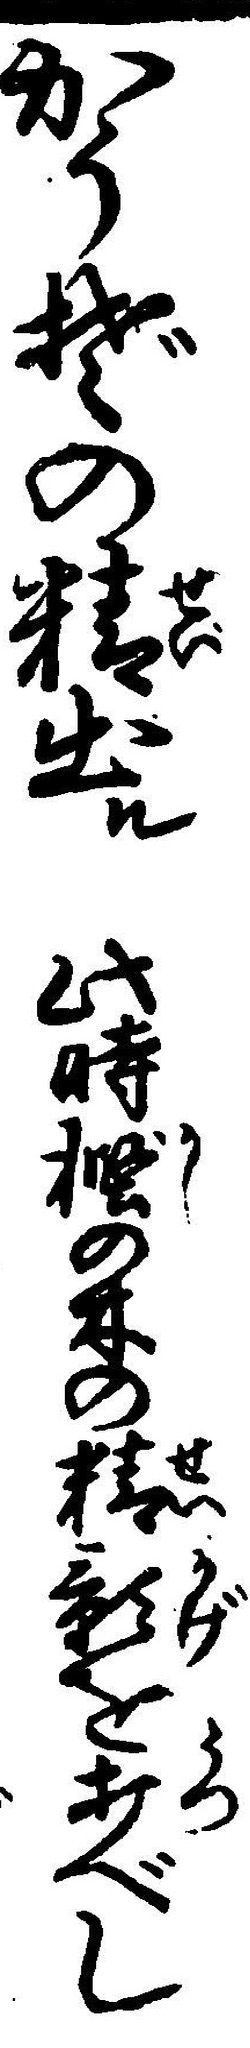かうぞの精出此時樫の木の精影を打べし
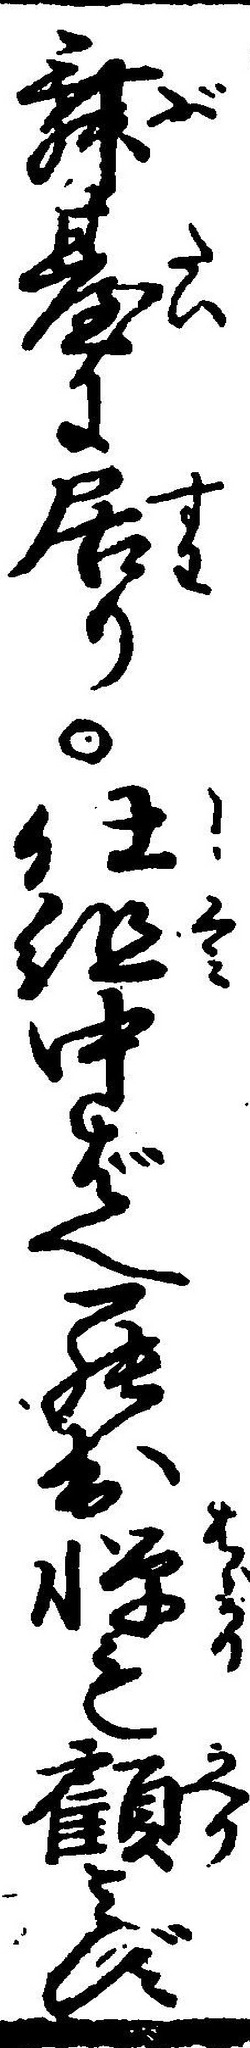舞台に居り○仕組中ばへ罷出憚も顧みず
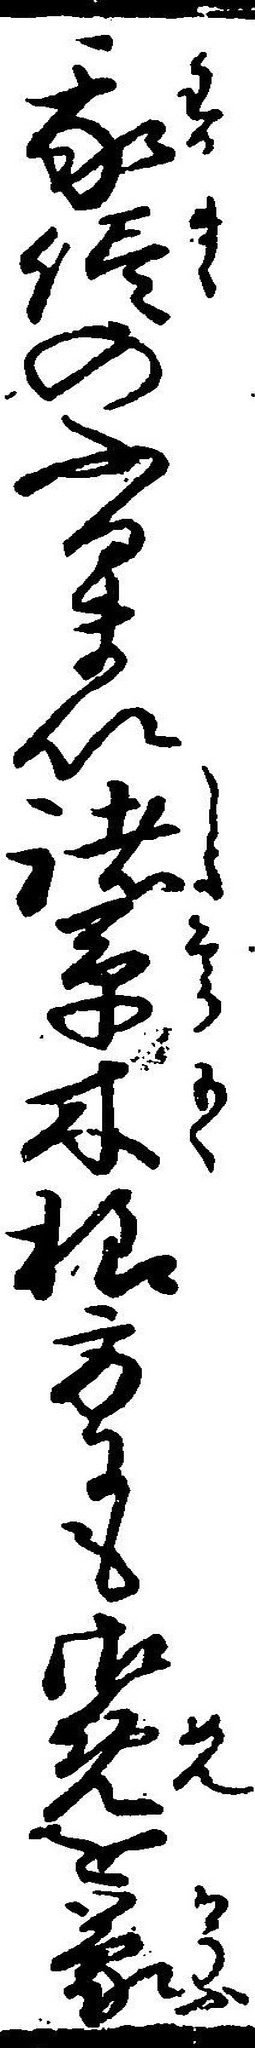我侭のふるまい諸草木根方にも御免蒙
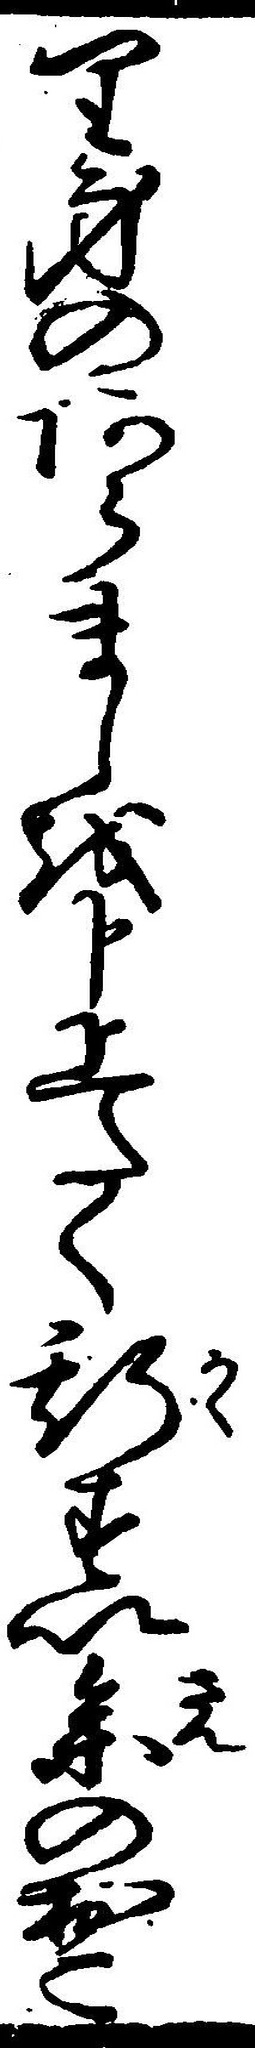り身のあらましを申上たく斯すい参のおこ
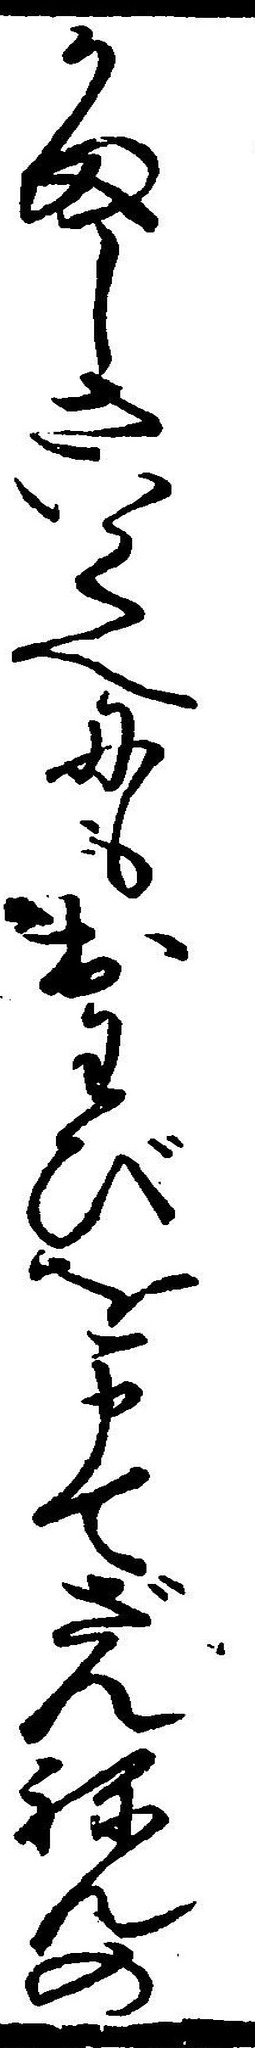かましさいくへにもおわびを申てざんねんの
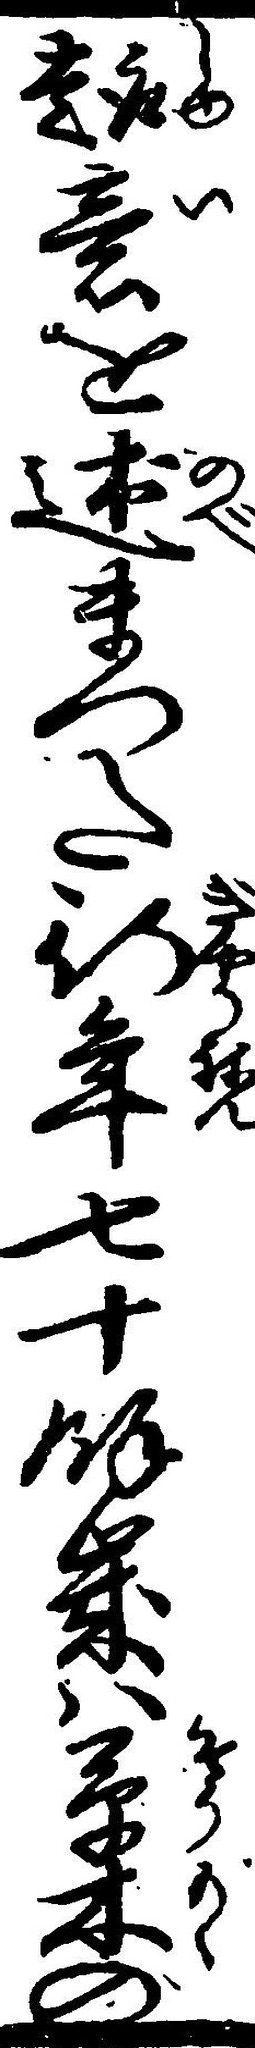趣意を述まつた行年七十余歳は草木の
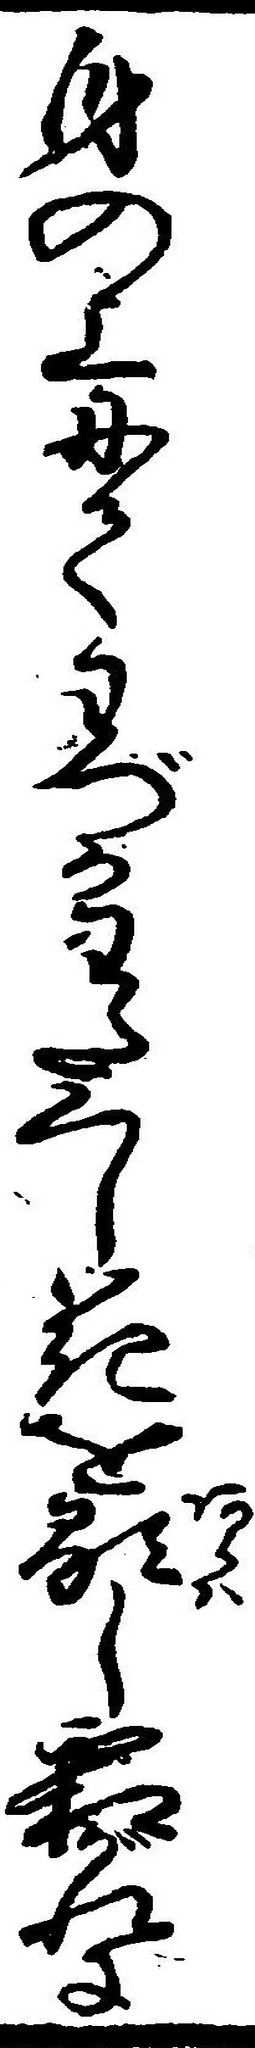身の上にてわづかわたくし花を顕し霜がれに
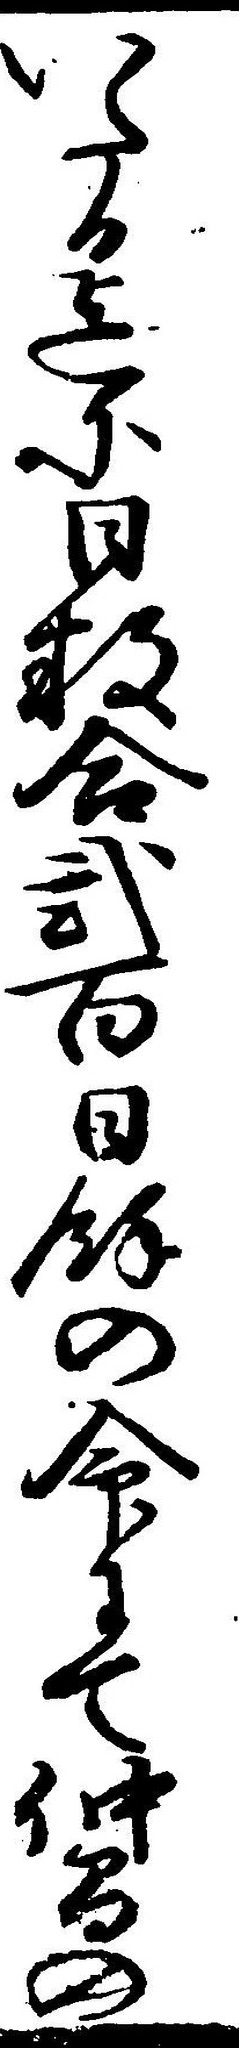いたる迄に日数合弐百日余の命にて仲間の
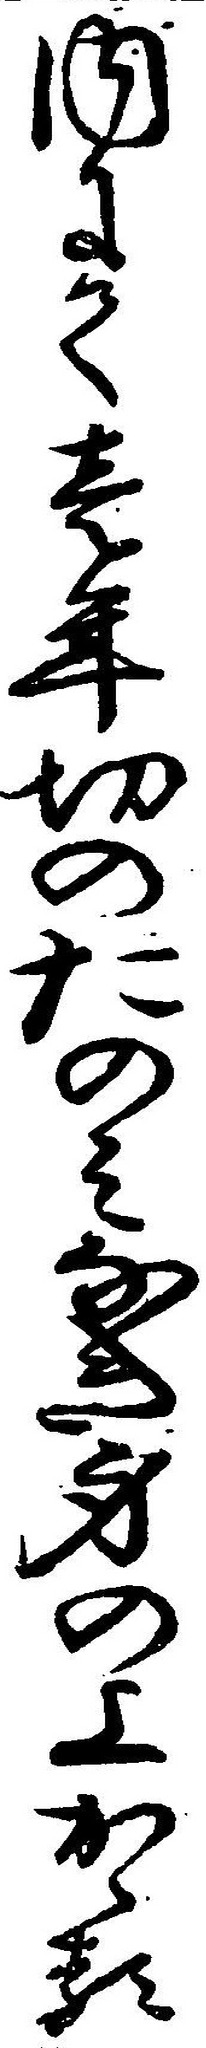内にて壱年切のたのみなき身の上かゝる

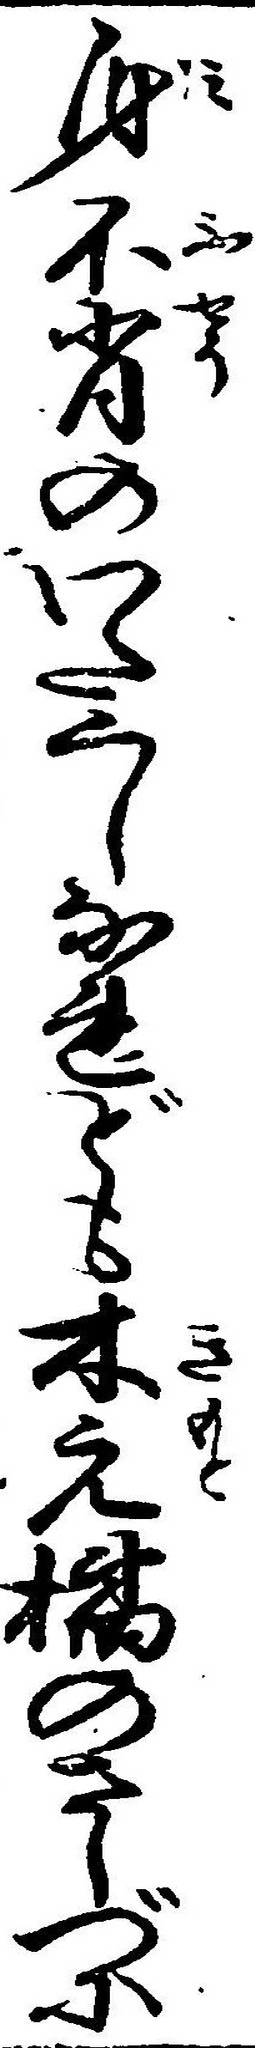身不肖のわたくしなれども木元橘のさしづに
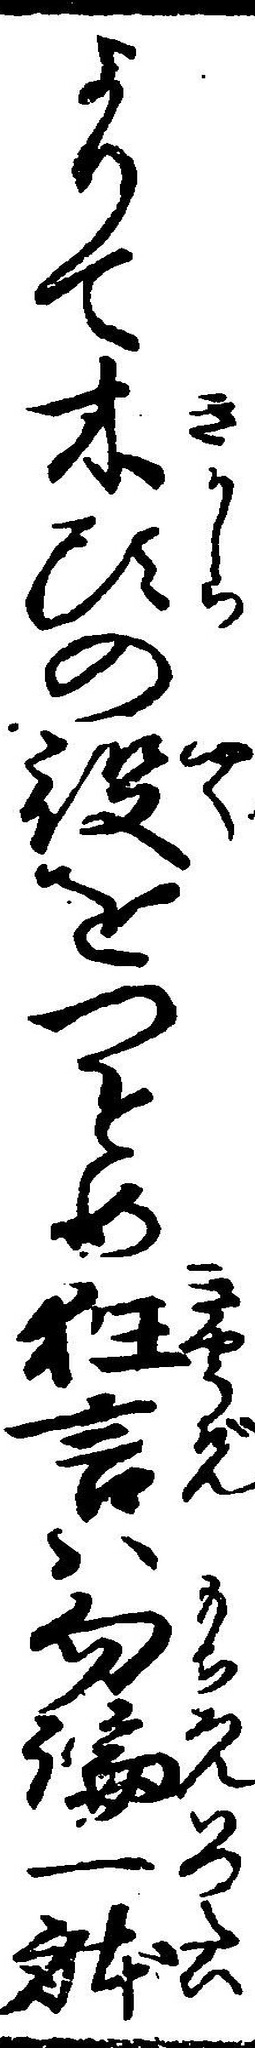よりて木頭の役をつとめ狂言は勿論一体
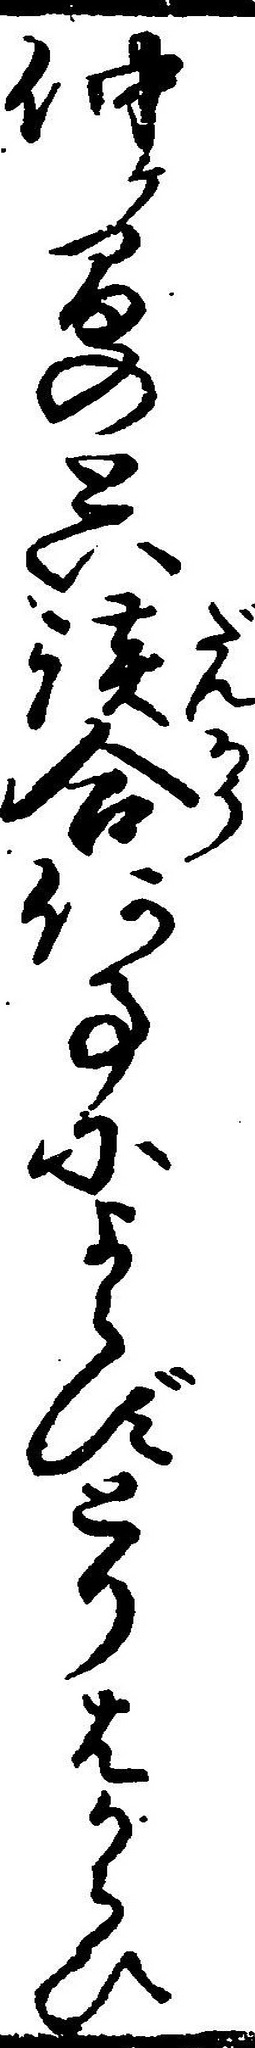仲ヶ間のとい談合何事によらずとりはからひ
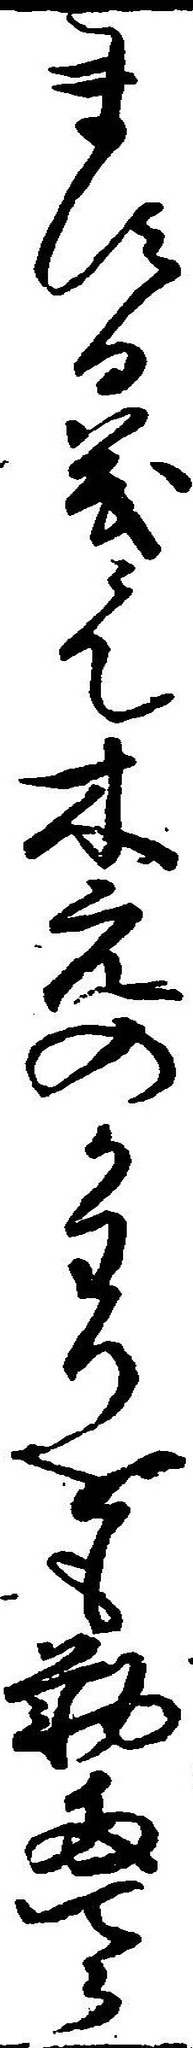まする義にて木元のかわりをも勤たてら
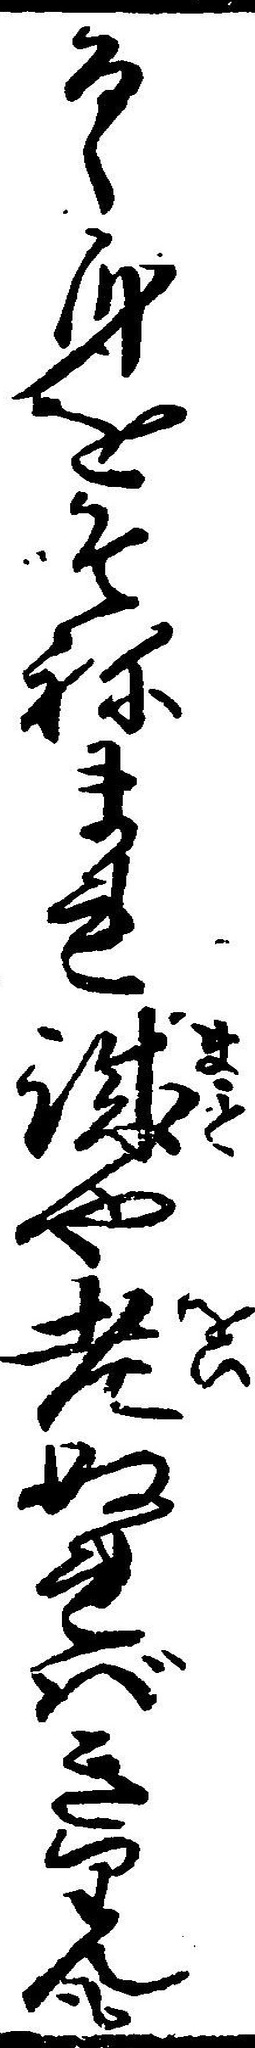るゝ身をそねまれ誠や老ぬればきりんも
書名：草木芝居化物退治 / 泉花堂三蝶(十六兵衛)作
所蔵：東京大学総合図書館 General Library in the University of Tokyo, JAPAN
